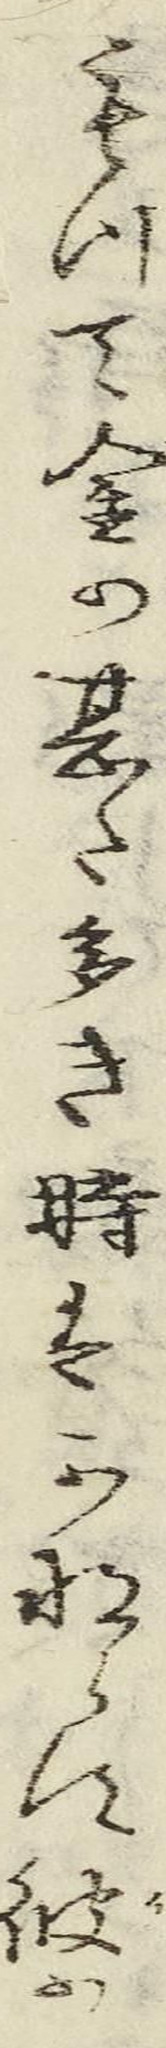もつて金の甚た多き時はかならす彼の
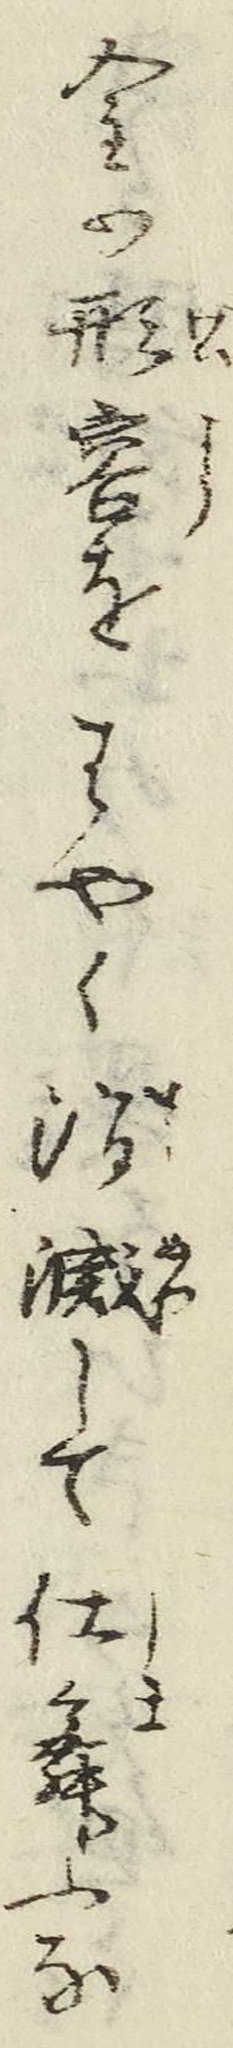金の形容をはやく消滅して仕舞ふな
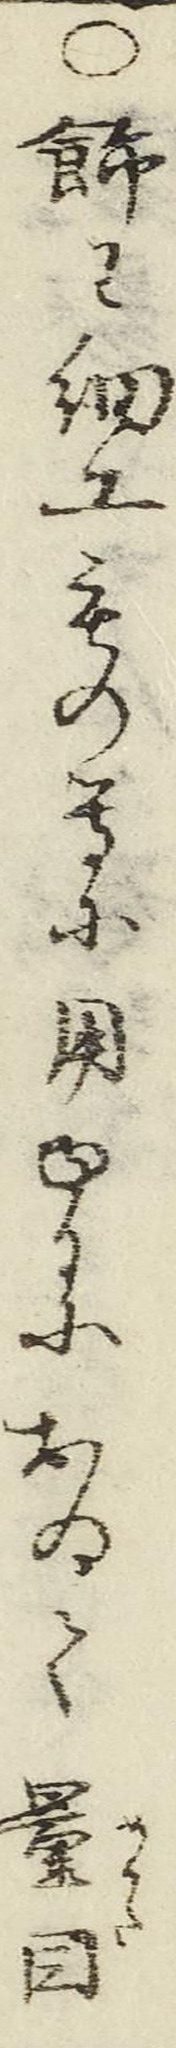○飾は細工もの等に用ゆるにおゐて量目
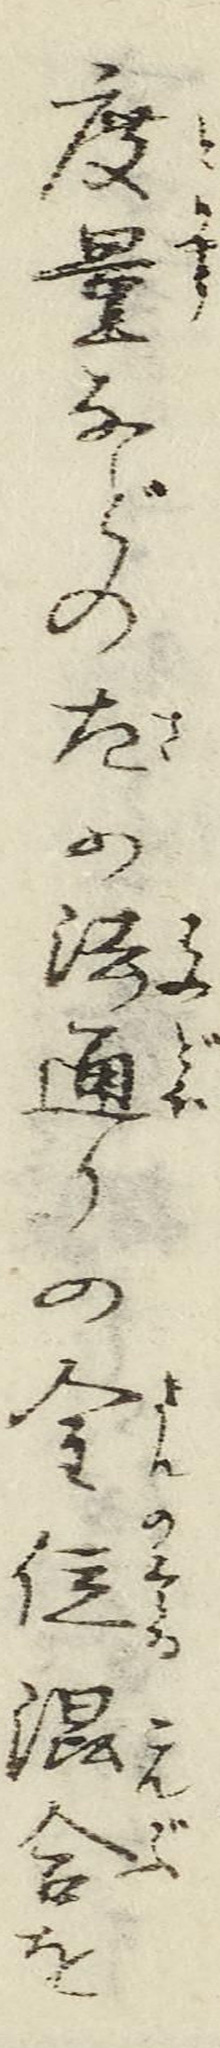度量などの左の法通りの金位混合を
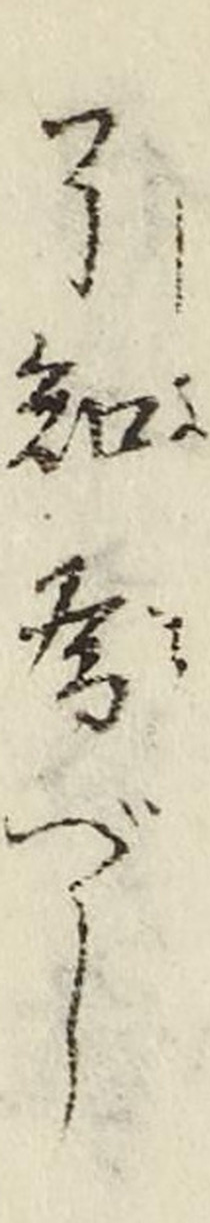了知為べし
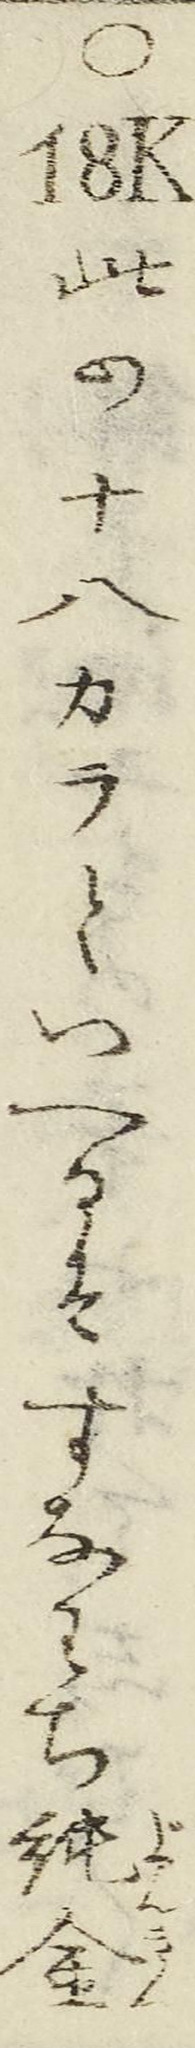○１８Ｋ此の十八カラといへるはすなはち純金
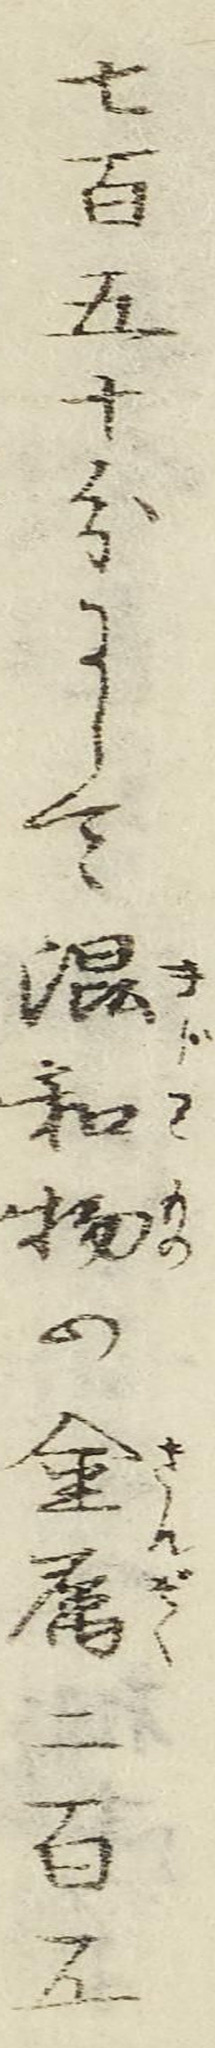七百五十分にして混和物の金属二百五
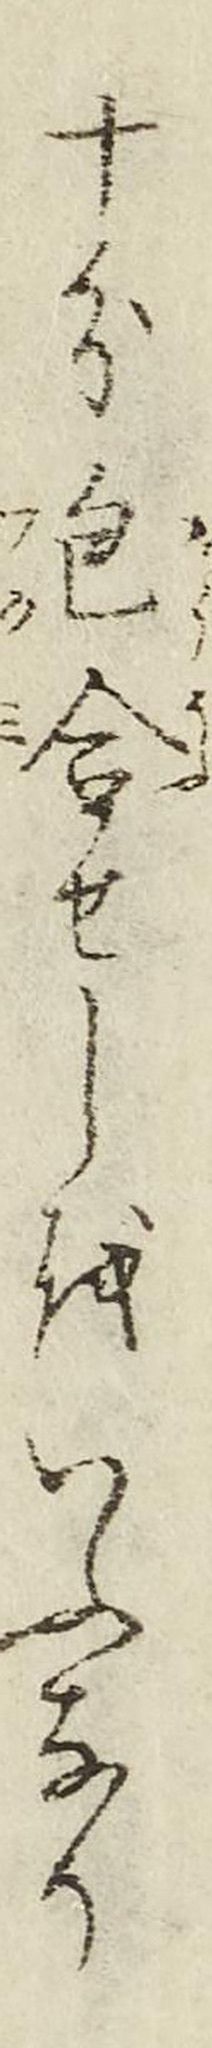十分包合せしをいふなり
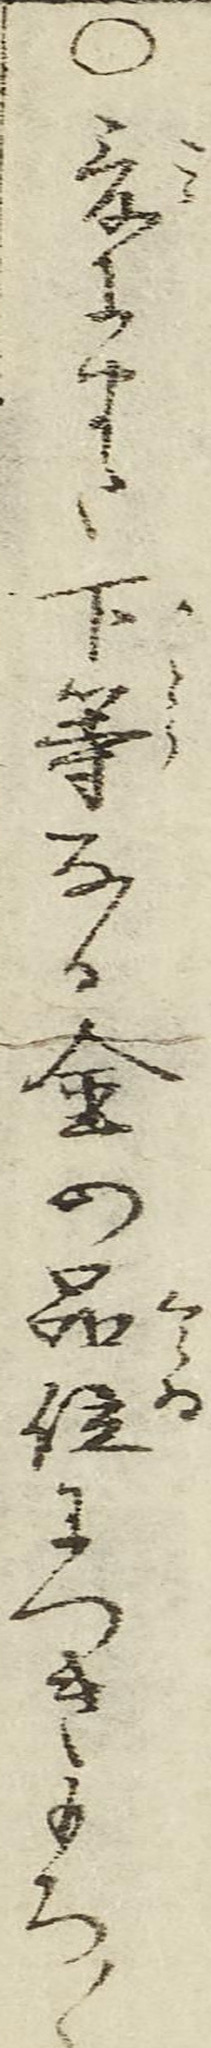○爰にまた下等なる金の品位につきもろ〳〵

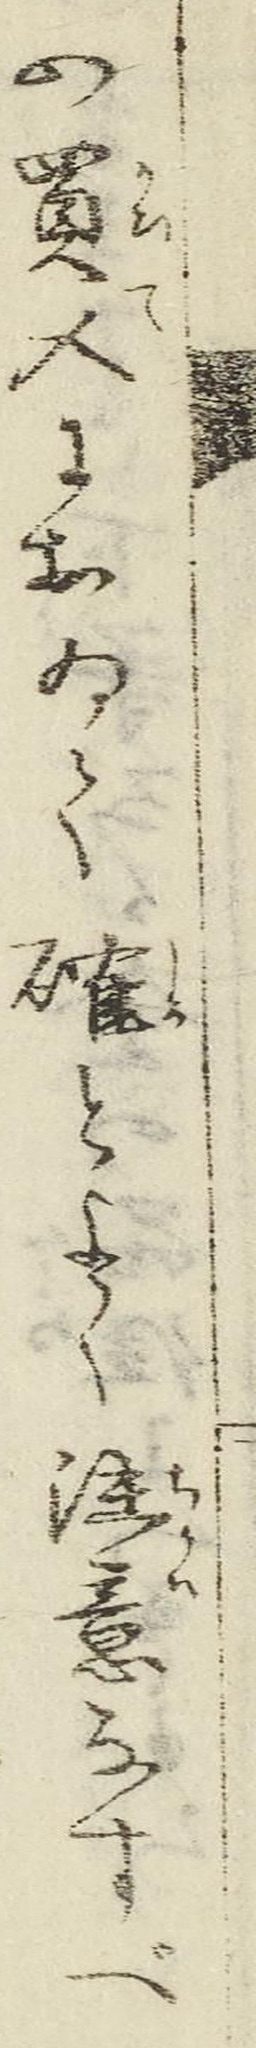の買人にあゐて確とよく注意なすべ
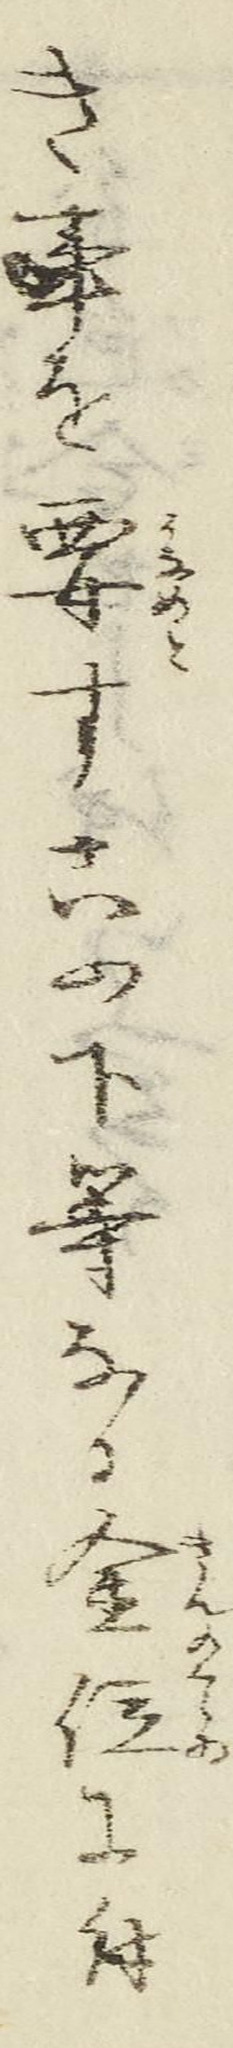き事を要すこの下等なる金位に付
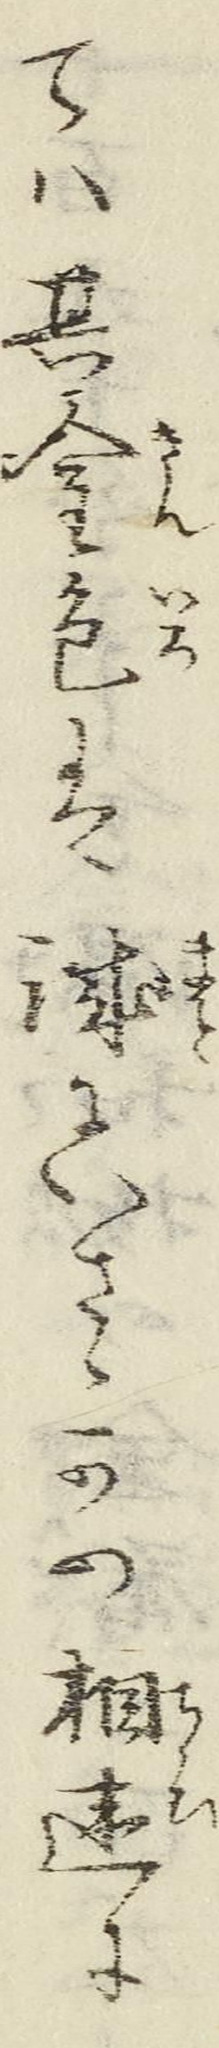ては其金色は誠にいさゝかの相違に
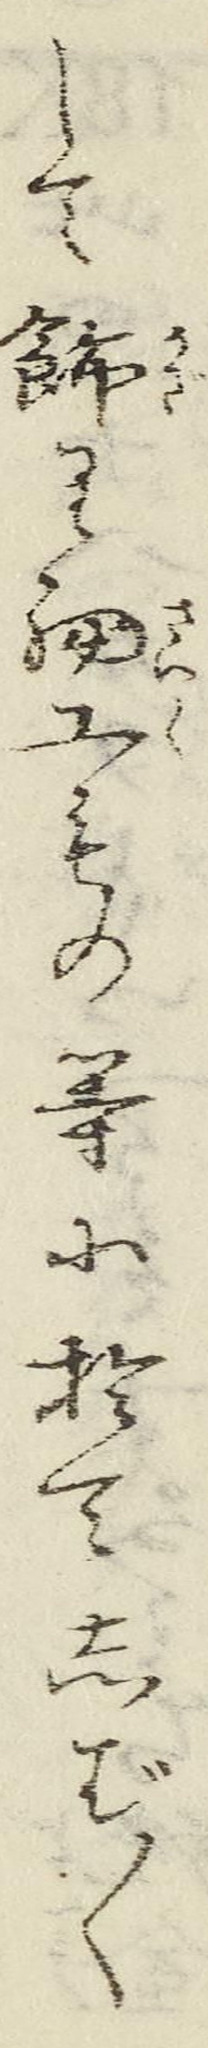して飾り細工もの等に於てしば〳〵
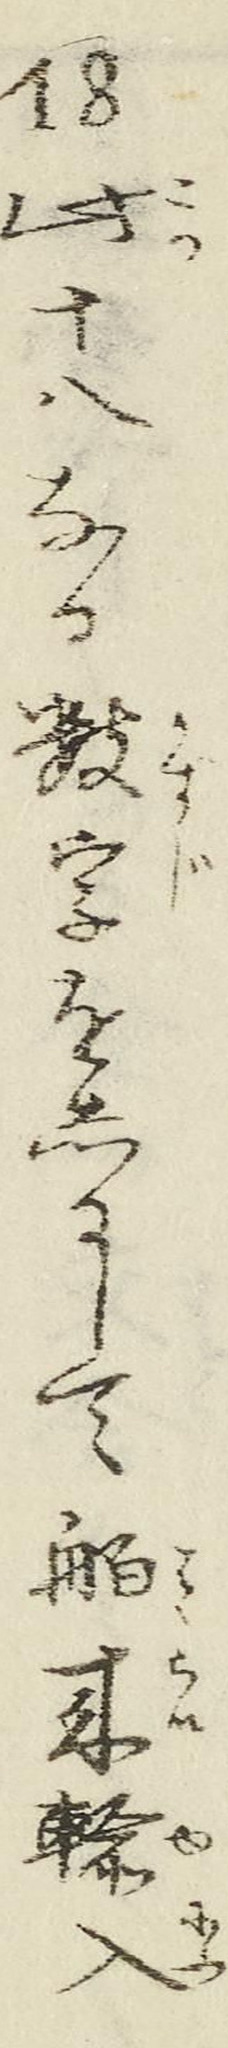⒙此十八なる数字をしるして舶来輸入
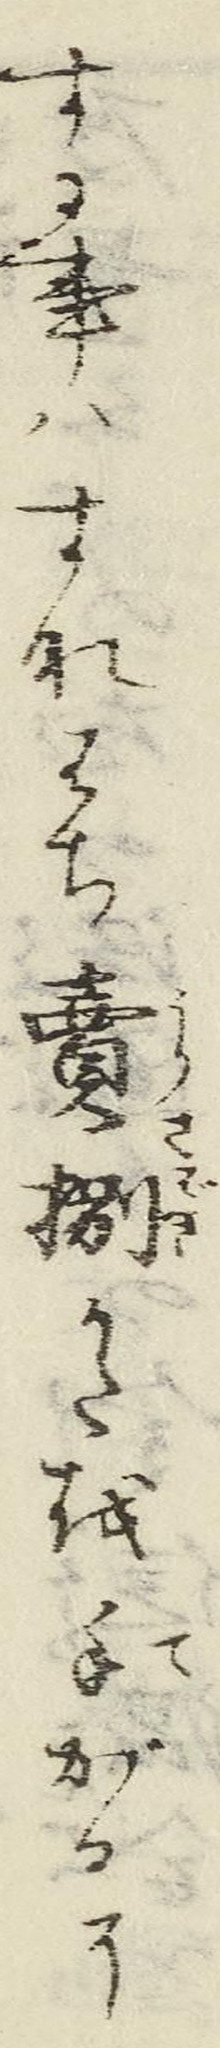する事はすなはち売捌かたを手がるに
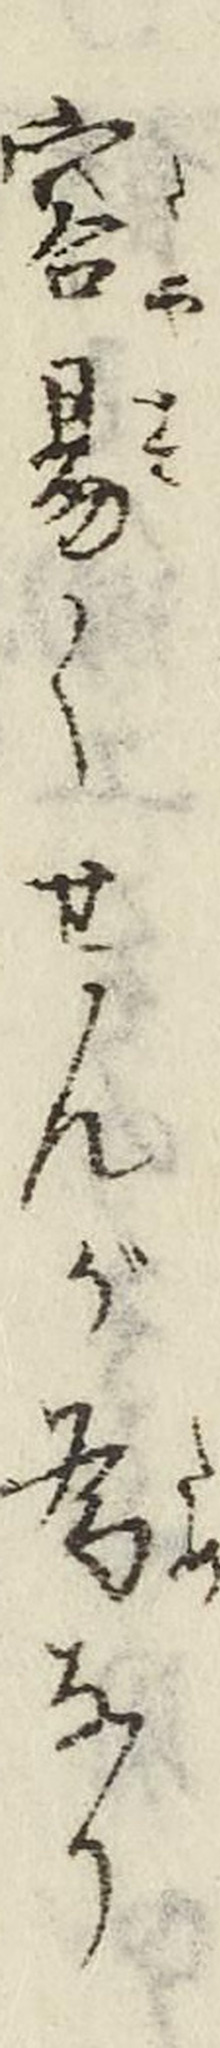容易くせんが為なり
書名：[時計に関する冊子]
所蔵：東京大学地震研究所図書室 Earthquake Research Institute Library, The University of Tokyo, JAPAN
